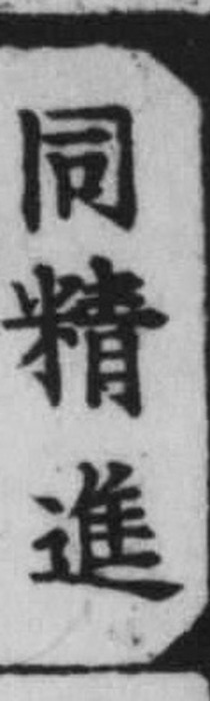同精進
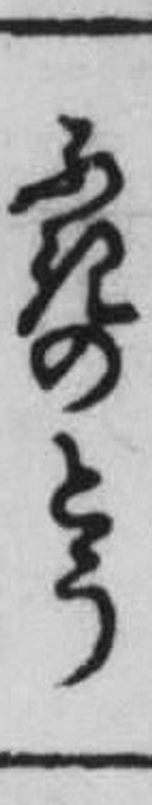ふきのとう
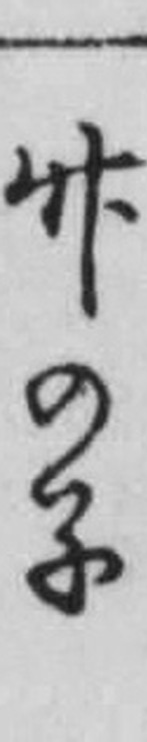竹の子
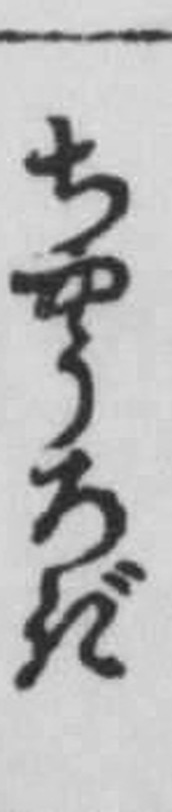ちやうろぎ
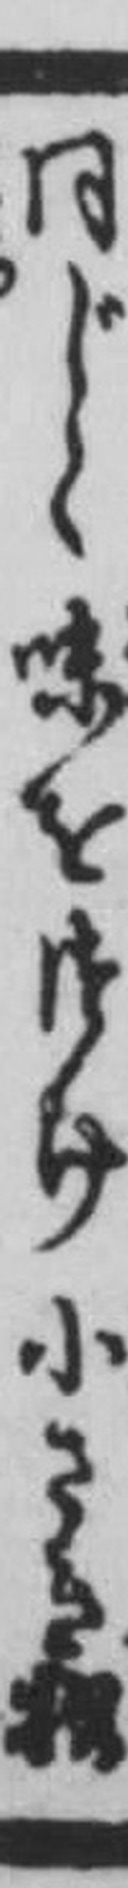同じく味をつけ小さき擂
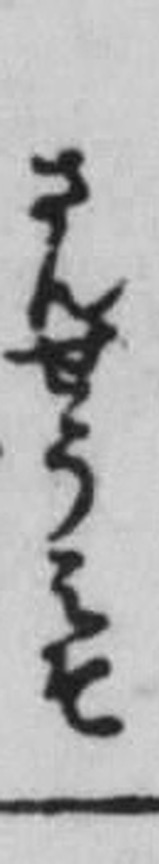さんせうみそ
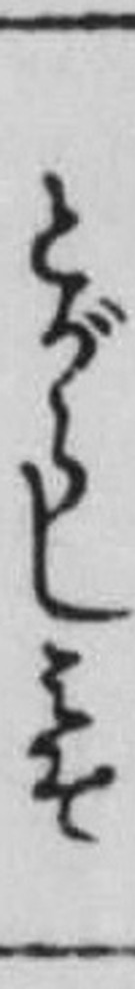とがらしみそ
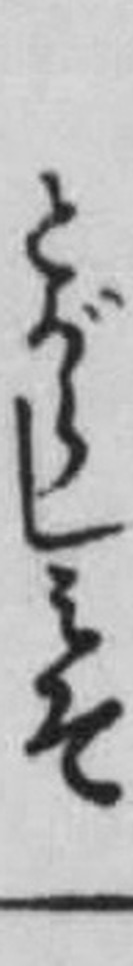とがらしみそ
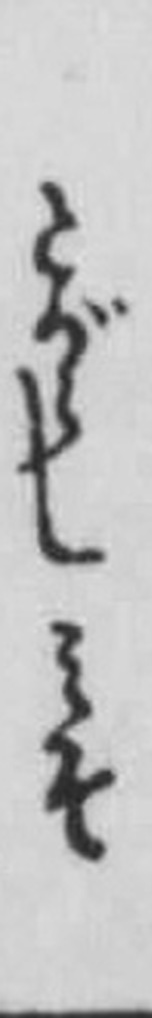とがらしみそ
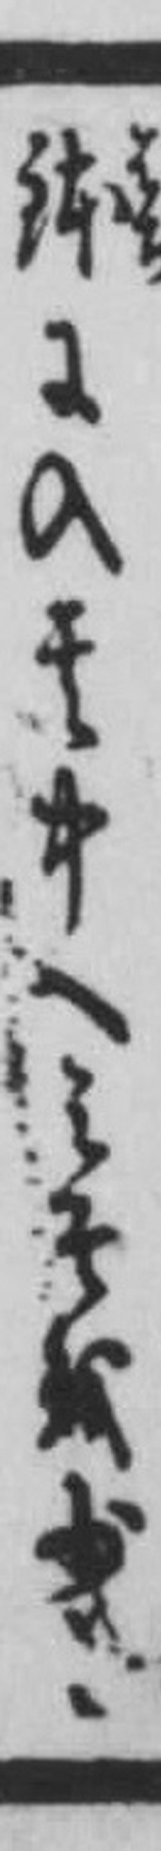鉢に入其中へみそを少し
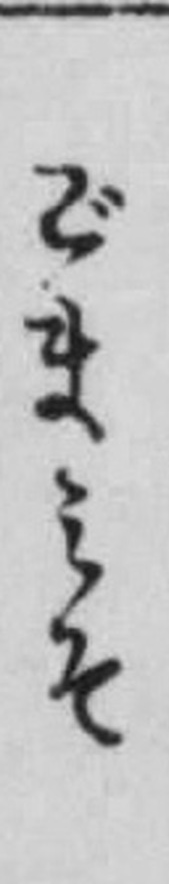ごまみそ
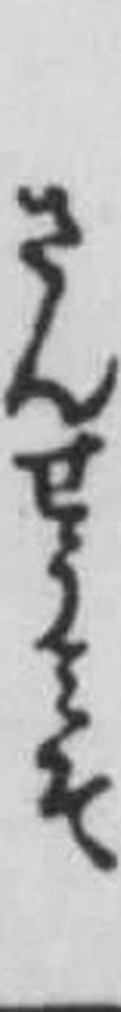さんせうみそ
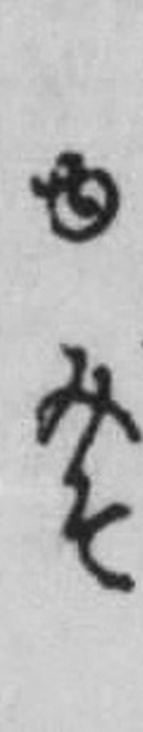ゆみそ
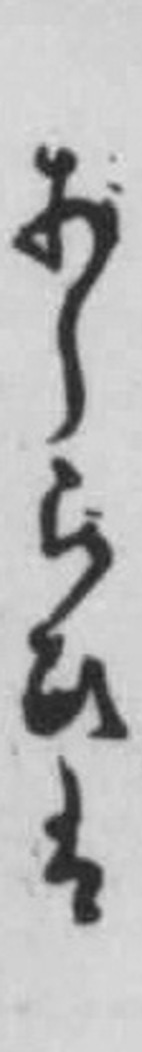あしらひは
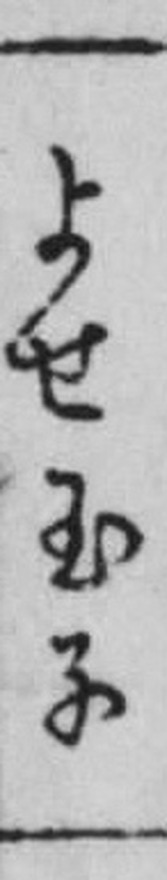よせ玉子
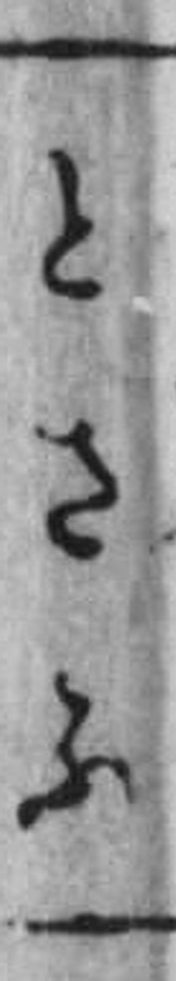とさふ
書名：日用重宝魚類精進/料理早工風
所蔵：大阪府立大学学術情報センター 国文学研究資料館
